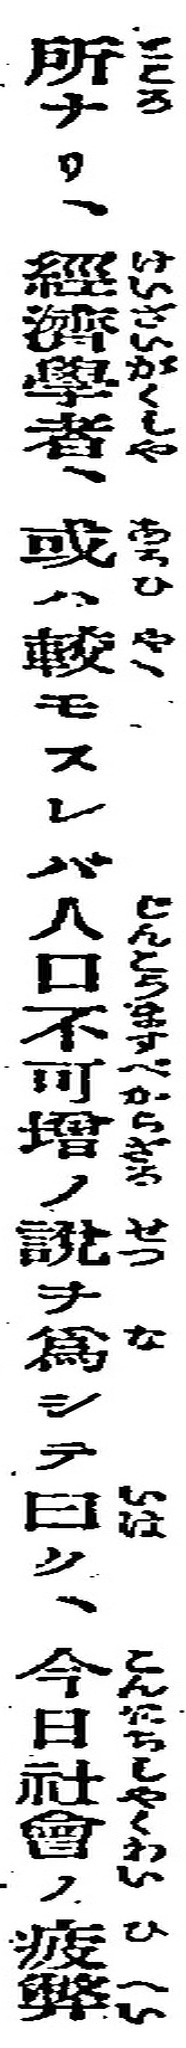所ナリ、経済学者、或ハ較モスレバ人口不可増ノ説ヲ為シテ曰ク、今日社会ノ疲弊
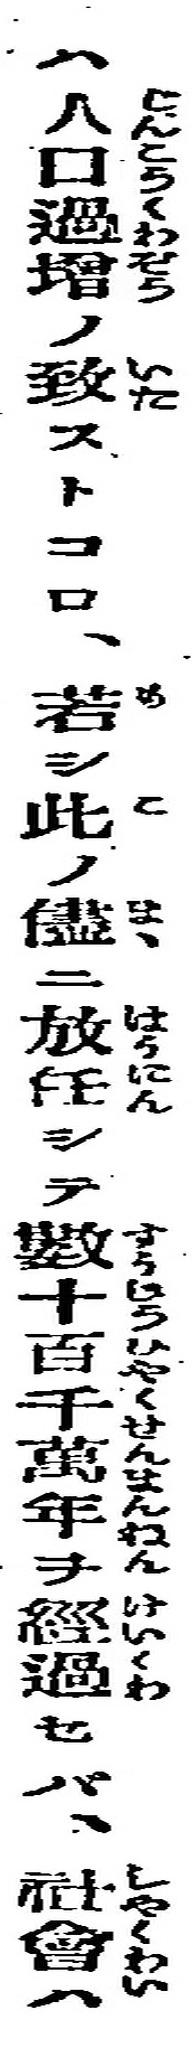ハ人口過增ノ致ストコロ、若シ此ノ侭ニ放任シテ数十百千万年ヲ経過セバ、社会ハ
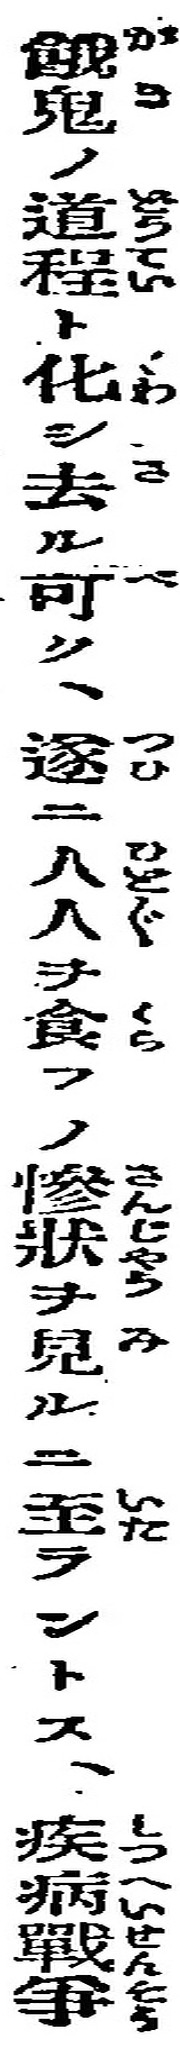餓鬼ノ道程ト化シ去ル可ク、遂ニ人人ヲ食フノ惨状ヲ見ルニ至ラントス、疾病戦争
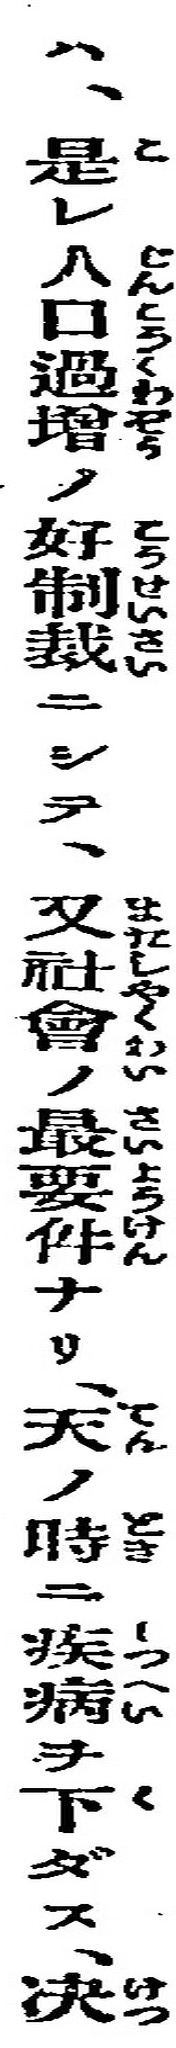ハ、是レ人口過増ノ好制裁ニシテ、又社会ノ最要件ナリ、天ノ時ニ疾病ヲ下ダス、決
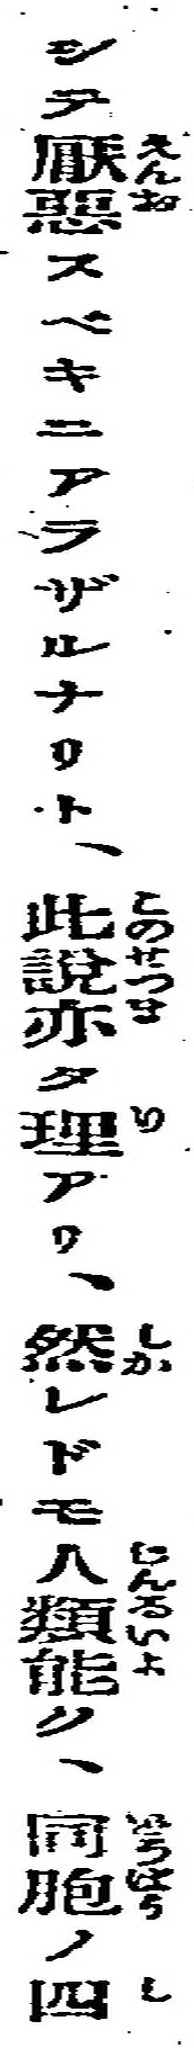シテ厭悪スベキニアラザルナリト、此説亦タ理アリ、然レドモ人類能ク、同胞ノ四
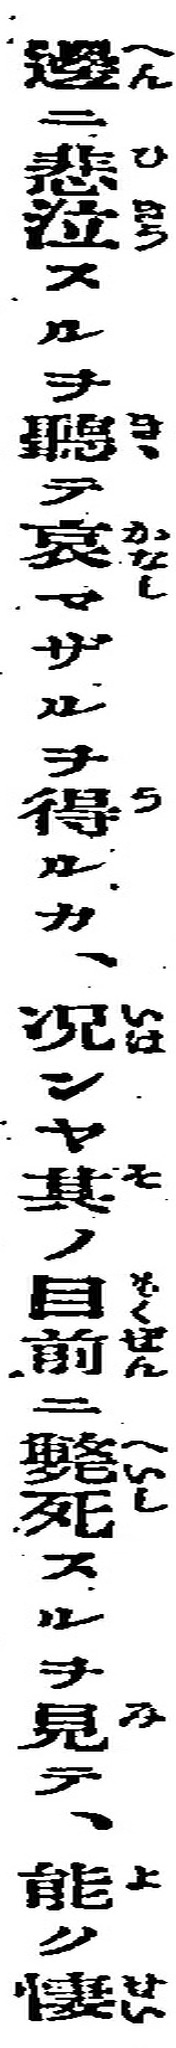辺ニ悲泣スルヲ聴テ哀マザルヲ得ルカ、況ンヤ其ノ目前ニ斃死スルヲ見テ、能ク悽
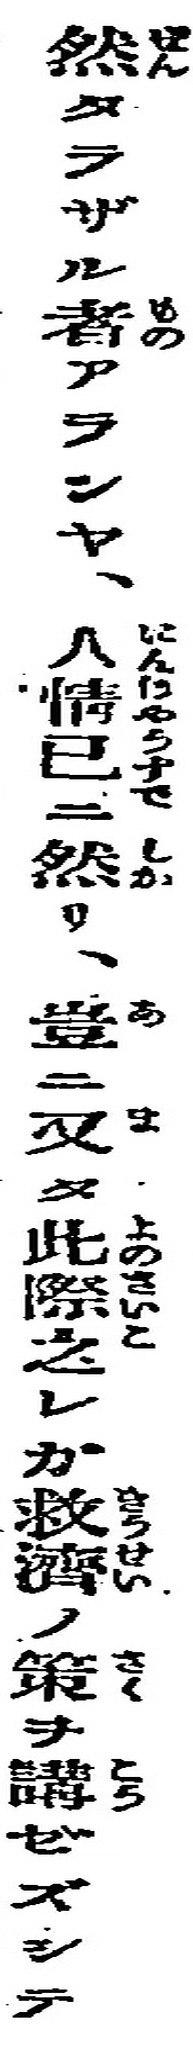然タラザル者アランヤ、人情已ニ然リ、豈ニ又タ此際之レガ救済ノ策ヲ講ゼズシテ
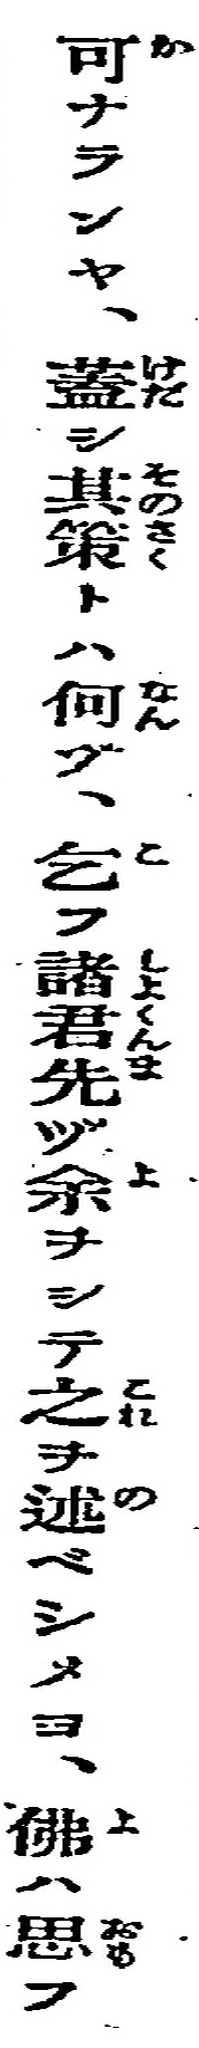可ナランヤ、蓋シ其策トハ何ゾ、乞フ諸君先ヅ余ヲシテ之ヲ述ベシメヨ、払ハ思フ
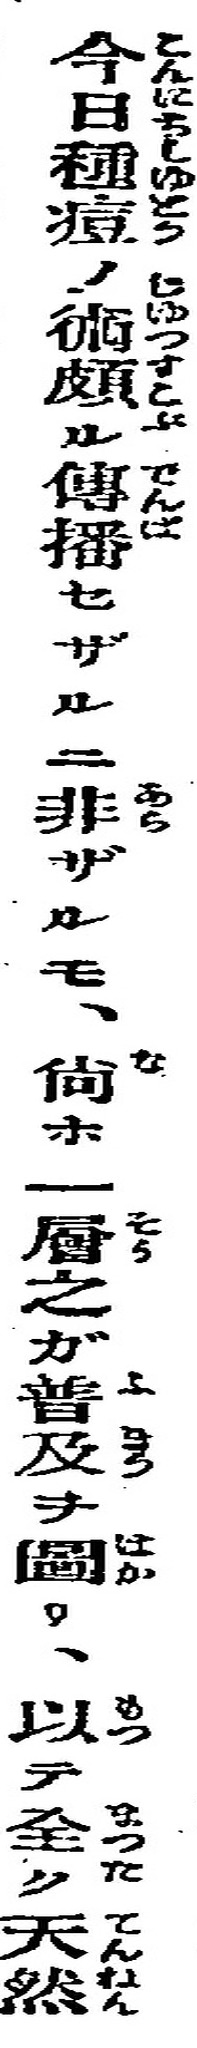今日種痘ノ術頗ル伝播セザルニ非ザルモ、尚ホ一層之ガ普及ヲ図リ、以テ全ク天然
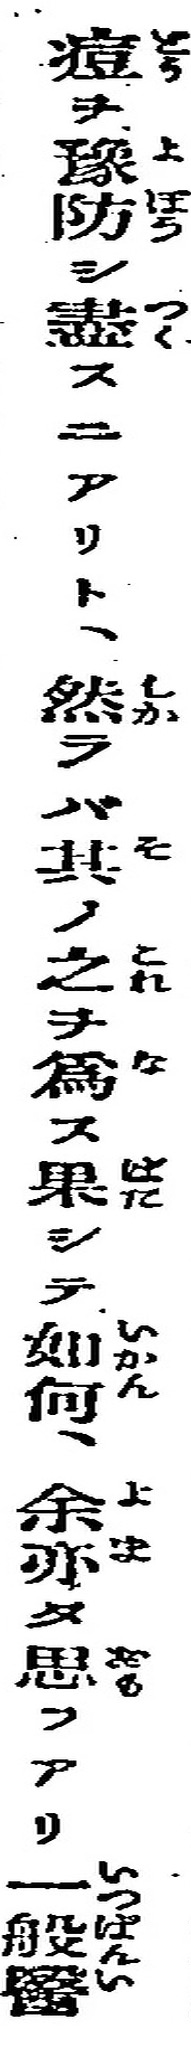痘ヲ予防シ尽スニアリト、然ラバ其ノ之ヲ為ス果シテ如何、余亦タ思フアリ一般医
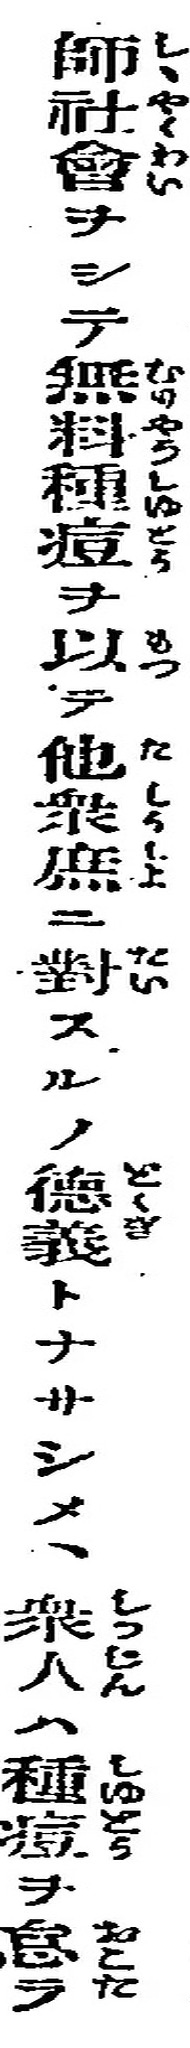師社会ヲシテ無料種痘ヲ以テ他衆庶ニ対スルノ徳義トナサシメ、衆人ハ種痘ヲ怠ラ
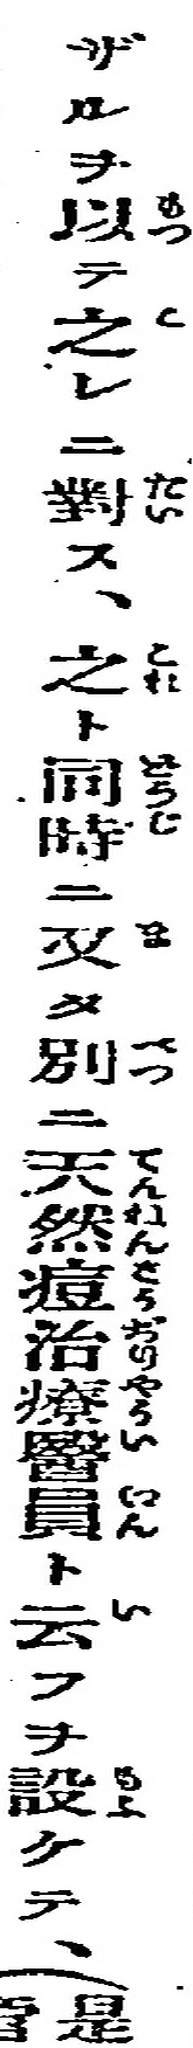ザルヲ以テ之レニ対ス、之ト同時ニ又タ別ニ天然痘治療医員ト云フヲ設ケテ、(是レ啻ニ
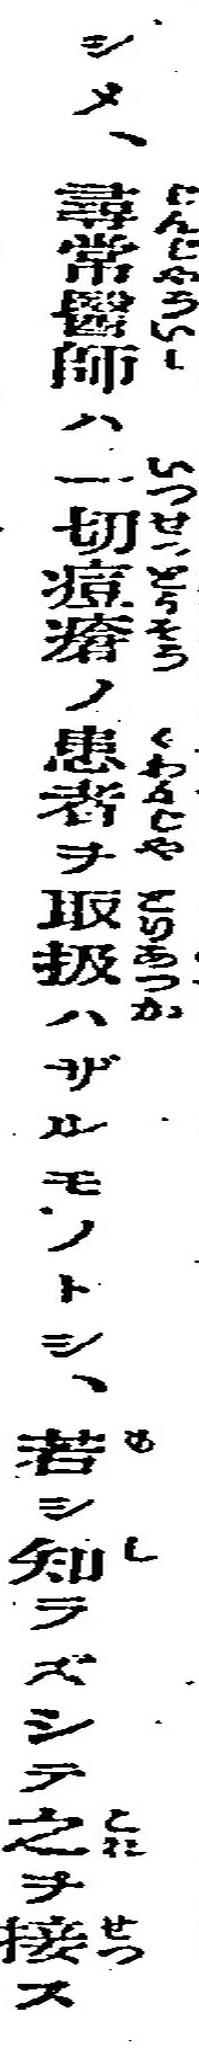シメ、尋常医師ハ一切痘瘡ノ患者ヲ取扱ハザルモノトシ、若シ知ラズシテ之ヲ接ス
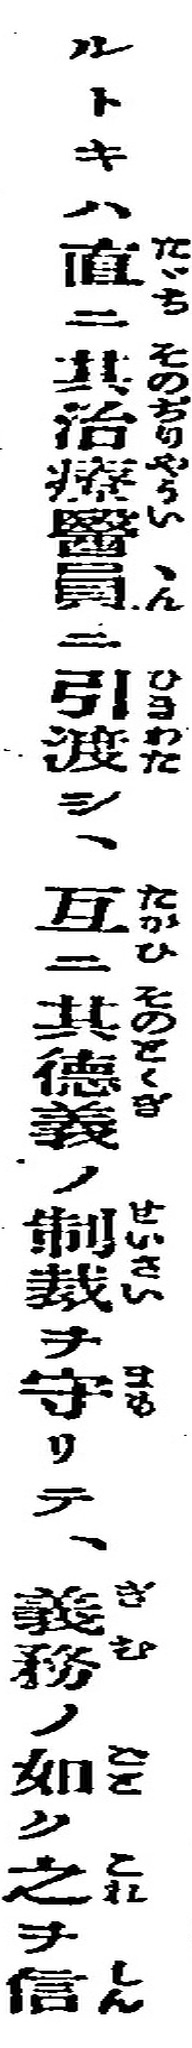ルトキハ直ニ其治療医員ニ引渡シ、互ニ其徳義ノ制裁ヲ守リテ、義務ノ如ク之ヲ信
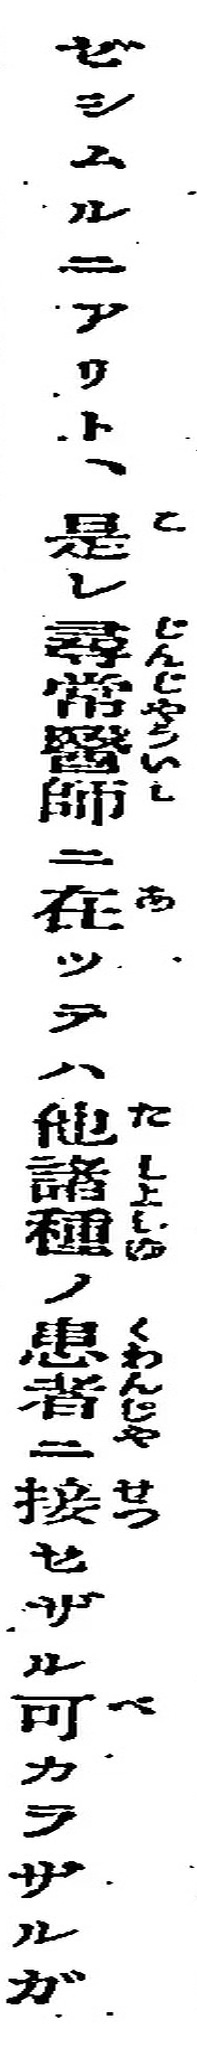ゼシムルニアリト、是レ尋常医師ニ在ツテハ他諸種ノ患者ニ接セザル可カラザルガ
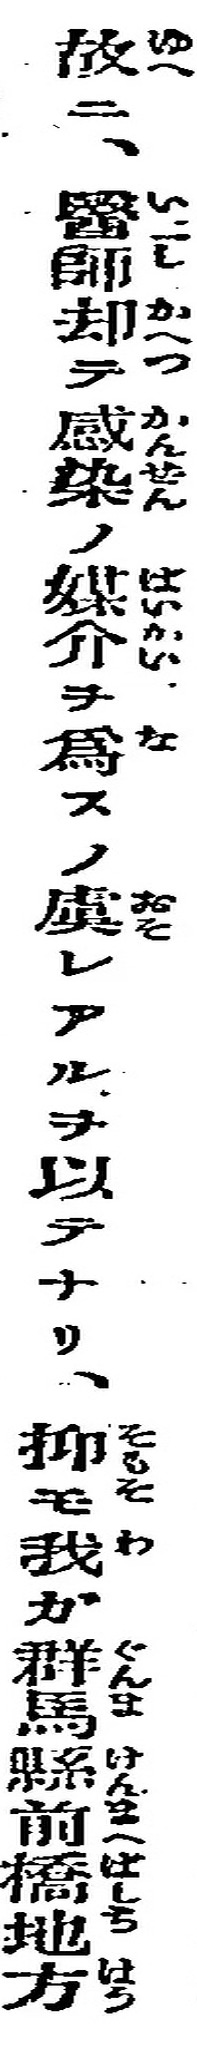故ニ、医師却テ感染ノ媒介ヲ為スノ虞レアルヲ以テナリ、抑モ我ガ群馬県前橋地方
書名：天然痘予防注意兼種痘者之注意
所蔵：国立国会図書館 National Diet Library, JAPAN
